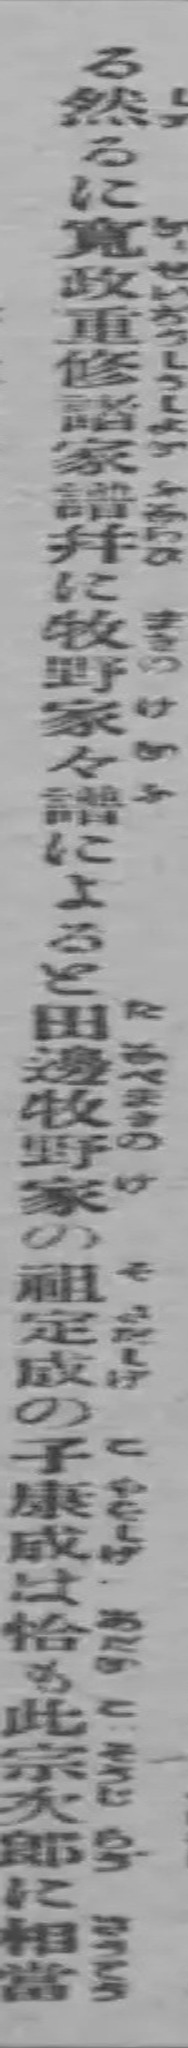る然るに寛政重修諸家譜幷に牧野家々譜によると田邉牧野家の祖定成の子康成は恰も此宗次郎に相当
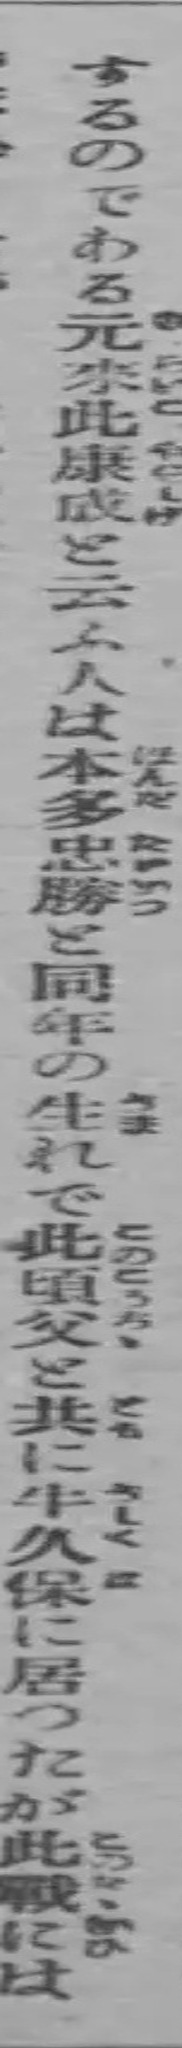するのである元来此康成と云ふ人は本多忠勝と同年の生れで此頃父と共に牛久保に居つたが此戦には
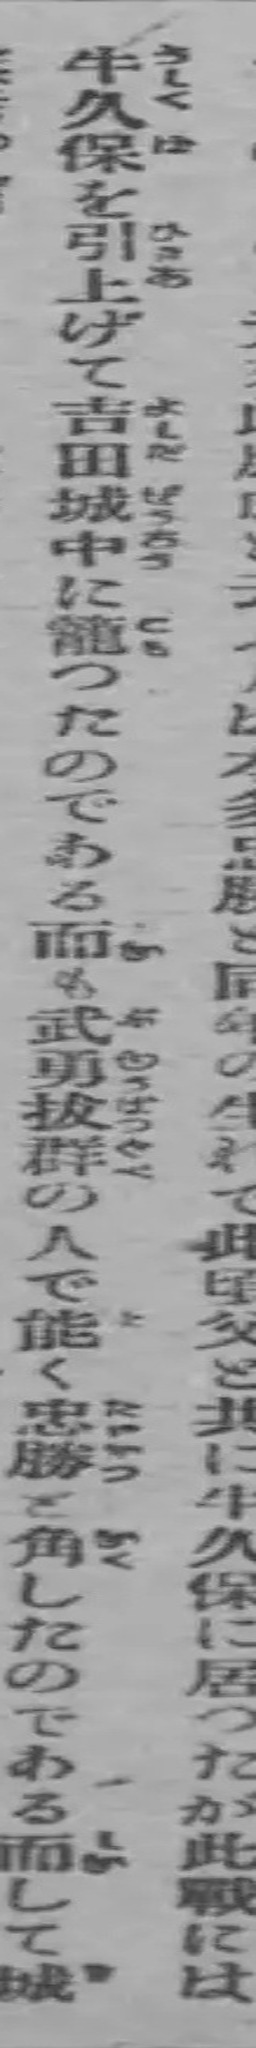牛久保を引上げて吉田城中に籠つたのである而も武勇抜群の人で能く忠勝と角したのである而して城
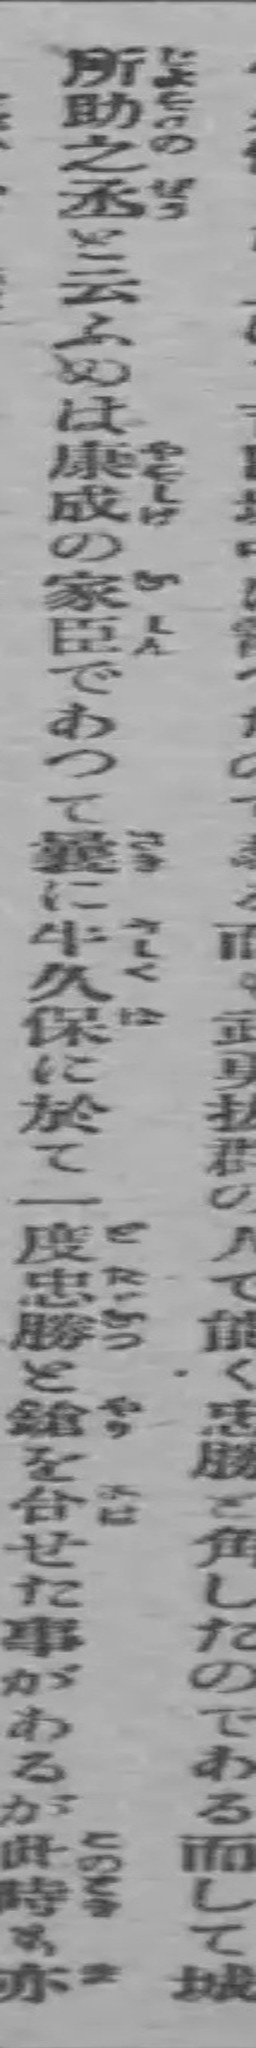城所助之丞所助之丞と云ふのは康成の家臣であつて曩に牛久保に於て一度忠勝と鎗を合せた事があるが此時も亦
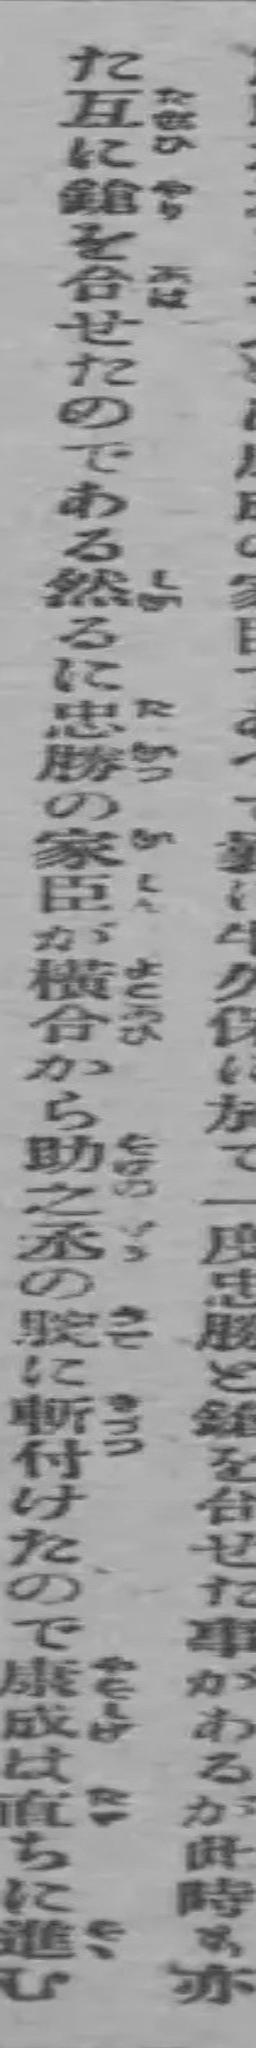た互に鎗を合せたのである然るに忠勝の家臣が横合から助之丞の腕に斬付けたので康成は直ちに進む
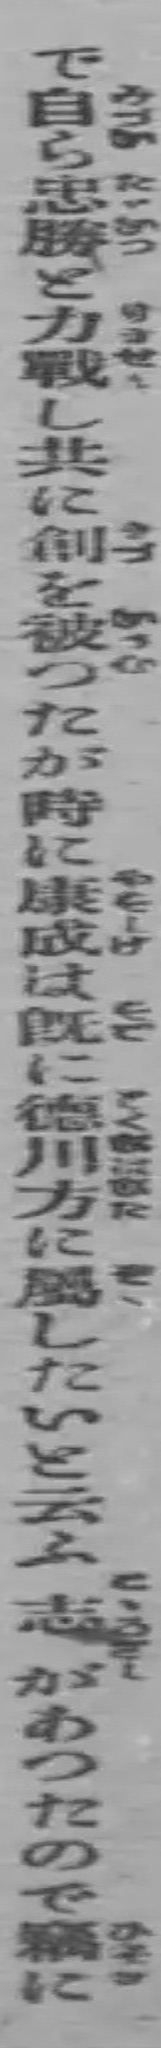で自ら忠勝と力戦し共に創を被つたが時に康成は既に徳川方に属したいと云ふ志があつたので竊に
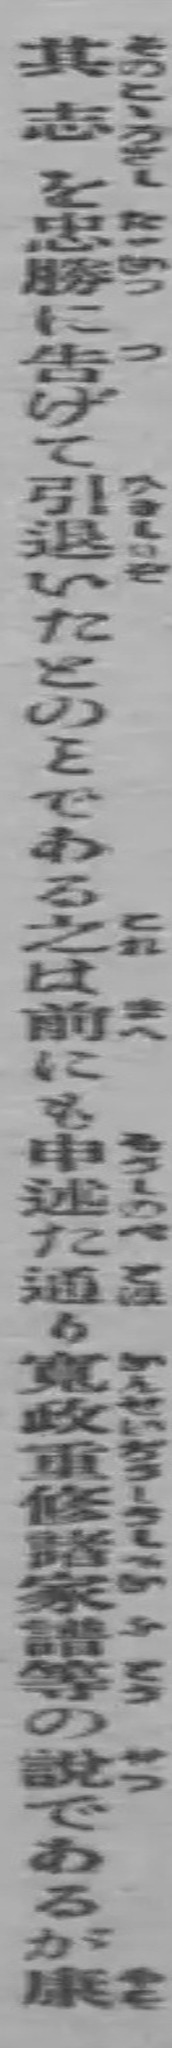其志を忠勝に告げて引退いたとのことである之は前にも申述た通り寛政重修諸家譜等の説であるが康
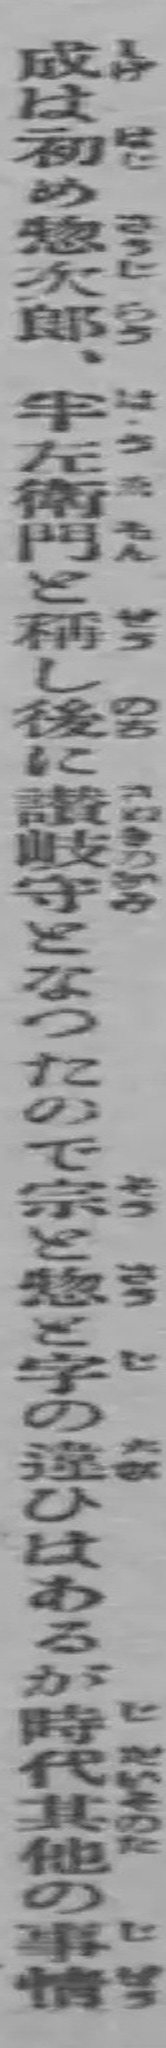成は初め惣次郎、半右衛門と称し後に讃岐守となつたので宗と惣と字の違ひはあるが時代其他の事情
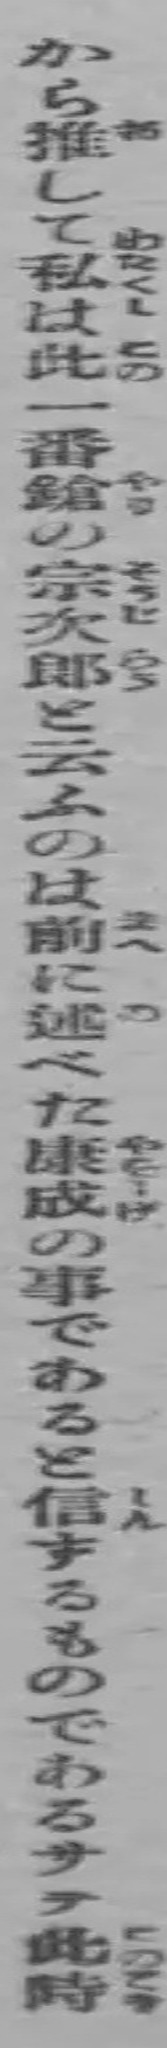から推して私は此一番鎗の宗次郎と云ふのは前に述べた康成の事であると信ずるものであるサテ此時
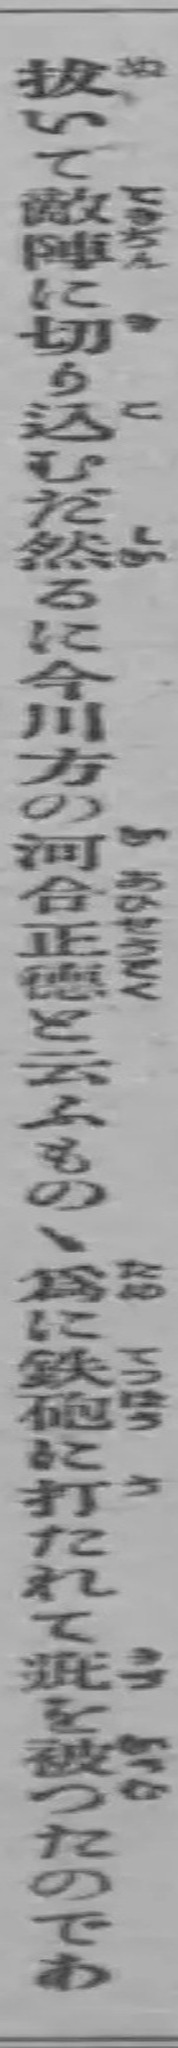抜いて敵陣に切り込むだ然るに今川方の河合正徳と云ふものゝ為に鉄砲に打たれて疵を被つたのであ
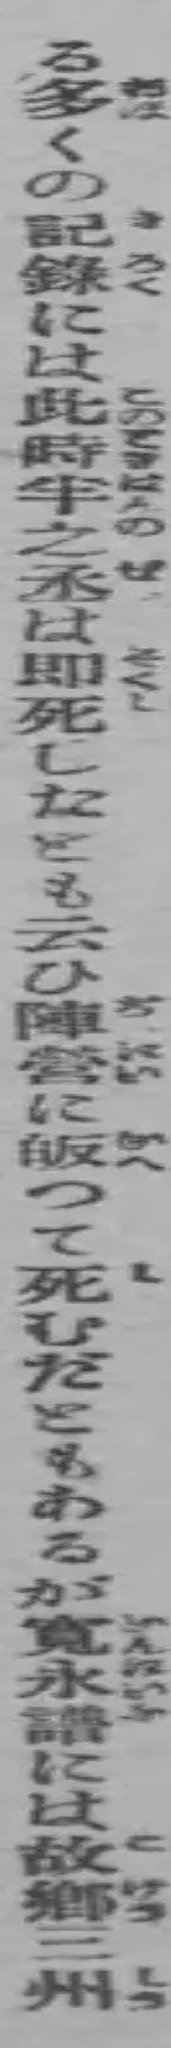る多くの記録には此時半之丞は即死したとも云ひ陣営に皈つて死むだともあるが寛永譜には故郷三州
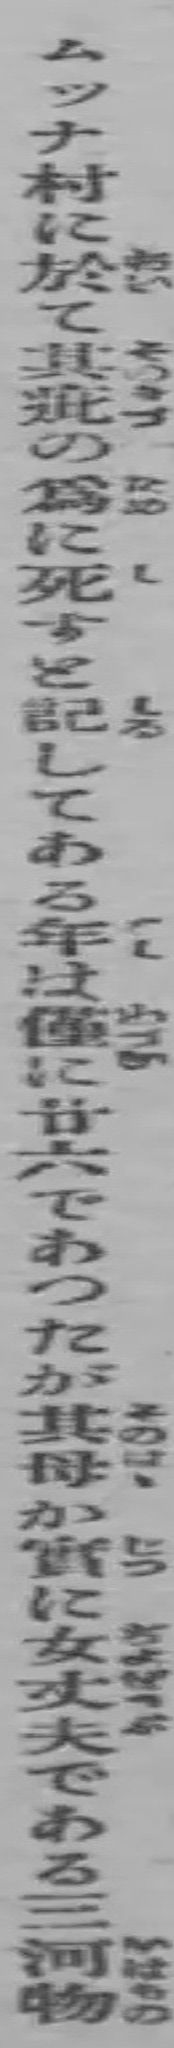ムツナ村に於て其疵の為に死すと記してある年は僅に廿六であつたが其母か実に女丈夫である三河物
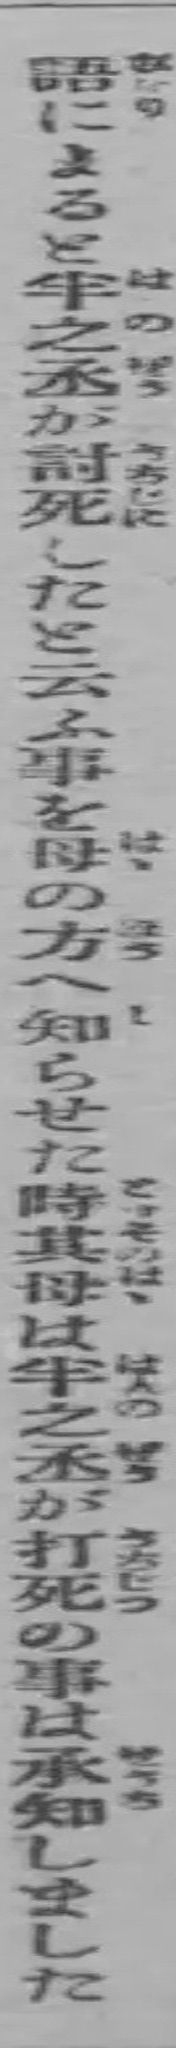貞次の母語によると半之丞が討死したと云ふ事を母の方へ知らせた時其母は半之丞が打死の事は承知しました
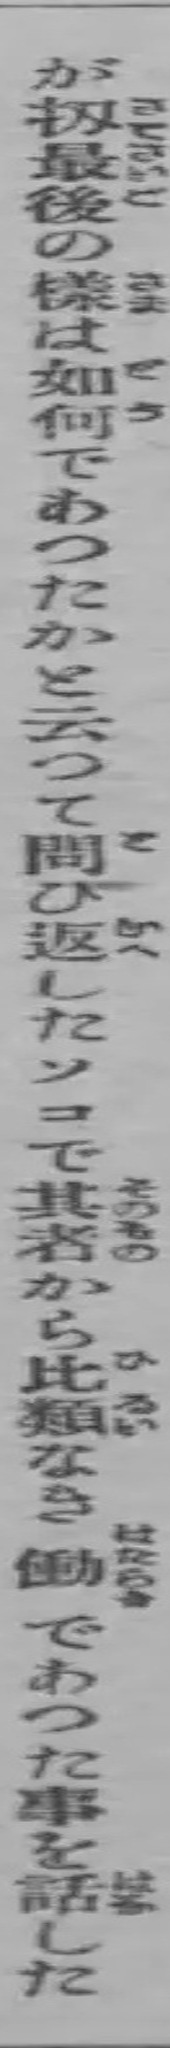が扨最後の様は如何であつたかと云つて問ひ返したソコで其者から比類なき働であつた事を話した
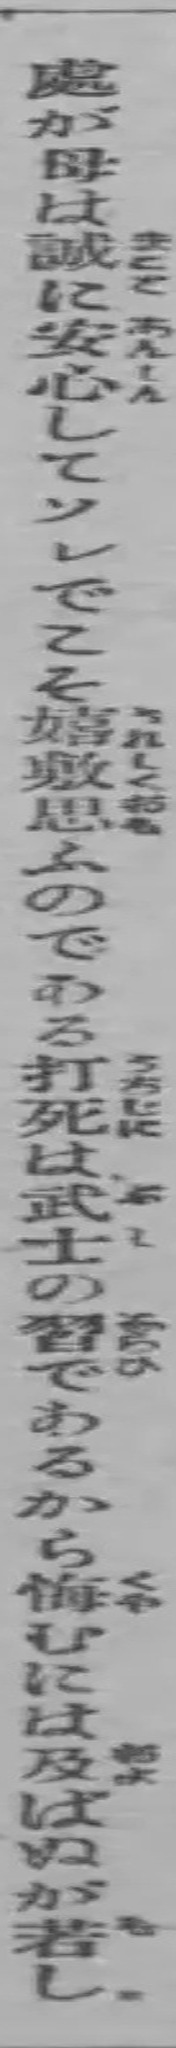処が母は誠に安心してソレでこそ嬉敷思ふのである打死は武士の習であるから悔むには及ばぬが若し
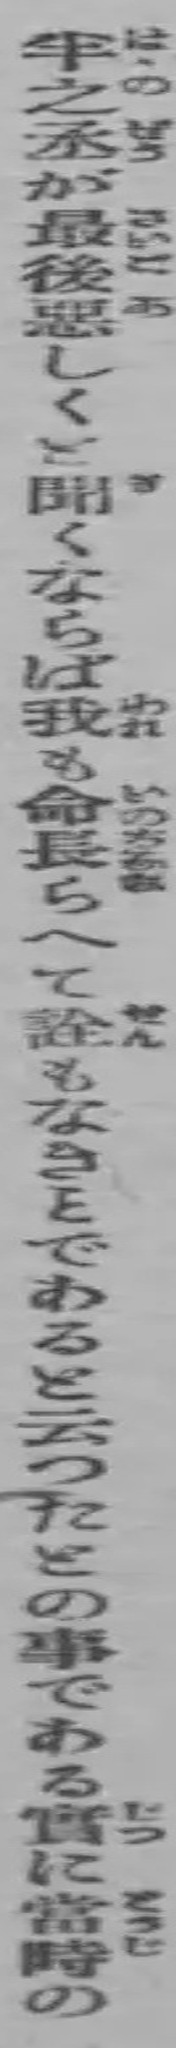半之丞が最後悪しくと聞くならば我も命長らへて詮もなきことであると云つたとの事である実に当時の
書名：豊橋市史談
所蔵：国立国会図書館 National Diet Library, JAPAN
